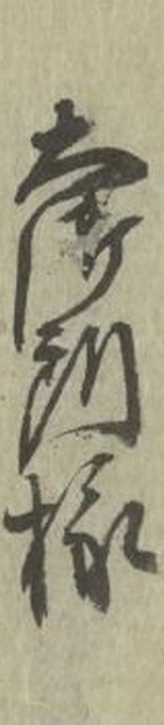大御所様
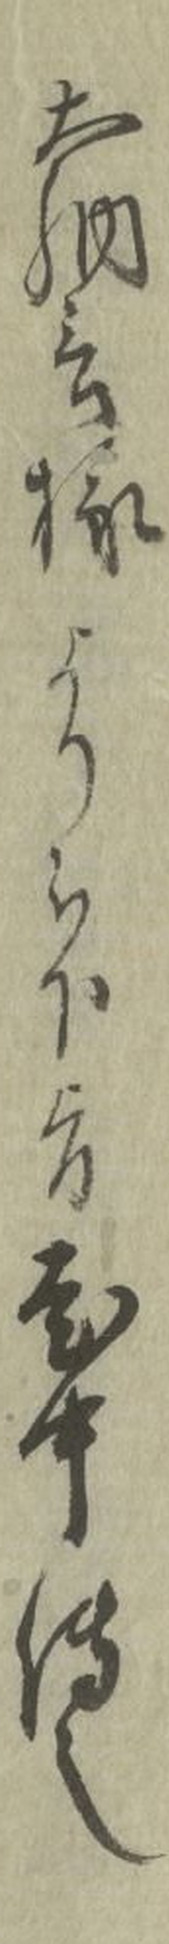大納言様より被下旨老中伝之

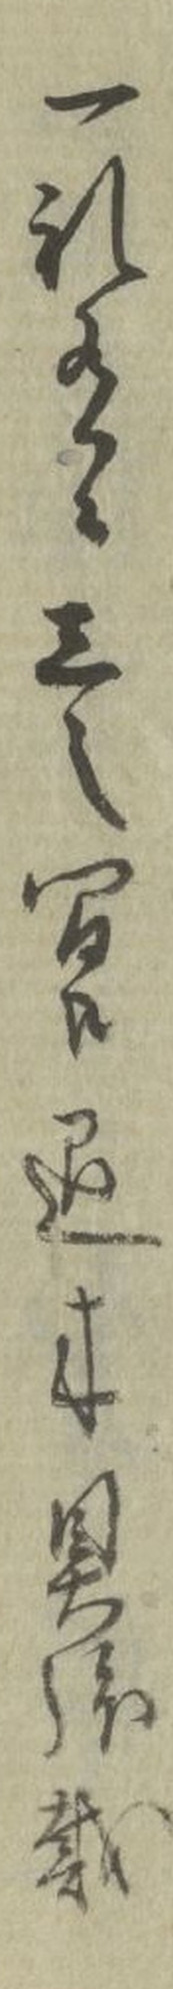一礼有而三之間え退来貝拝戴
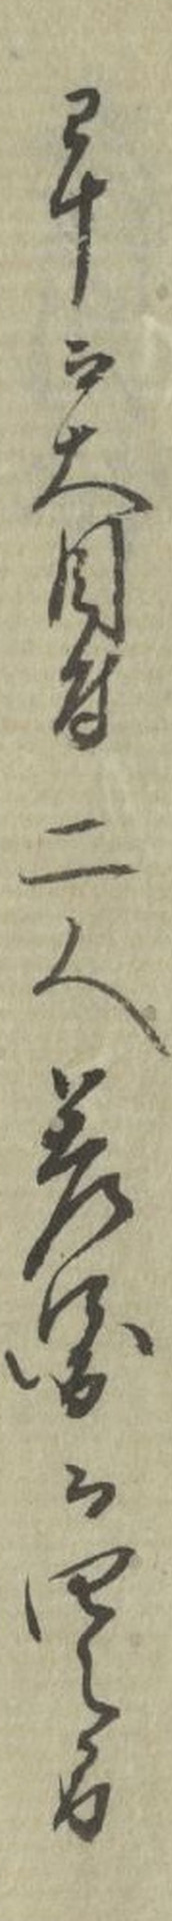畢而大目付二人差図而四之間
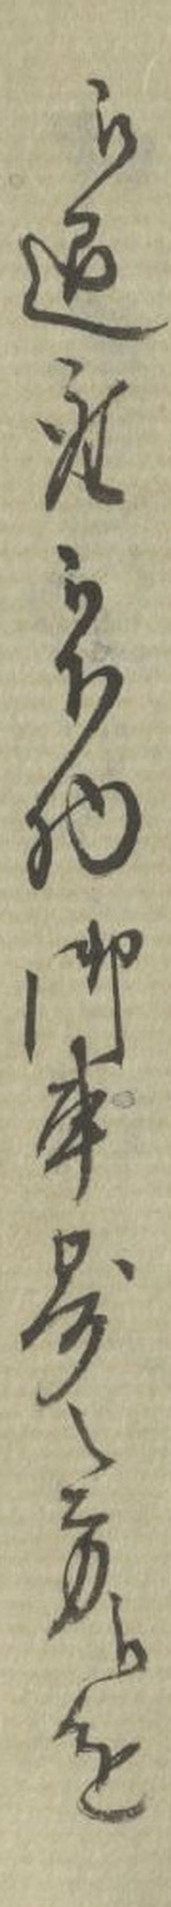え退座被下物御車寄之方え進
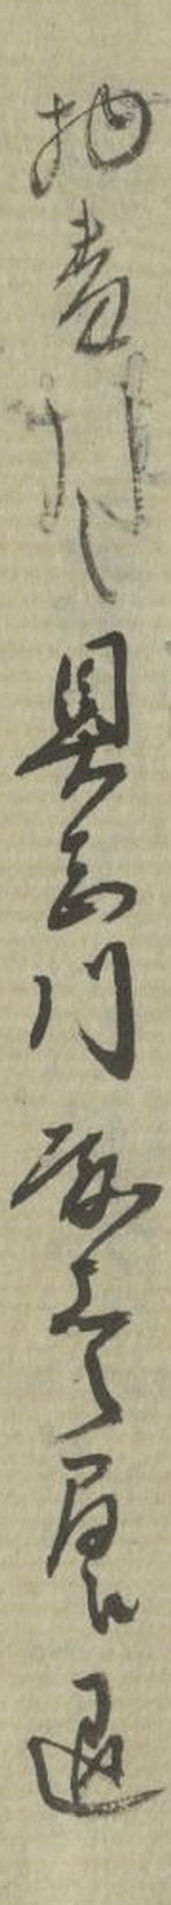物番引之具志川殿上之間え退
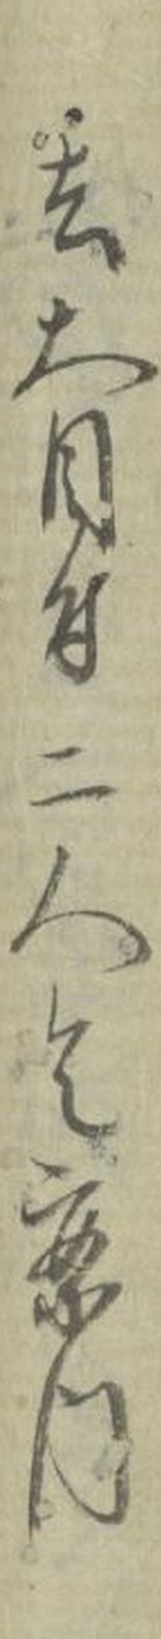去大目付二人令案内
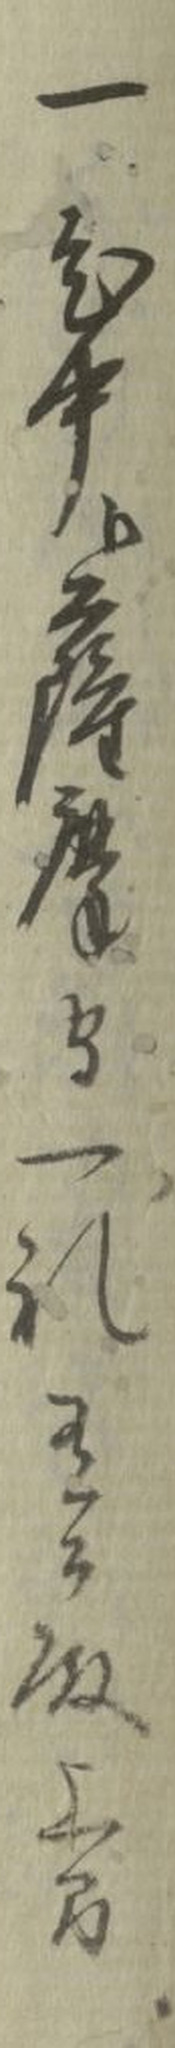一老中え薩摩守一礼有而殿上間
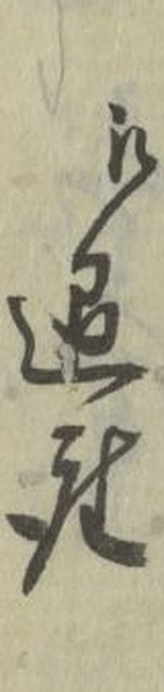え退座
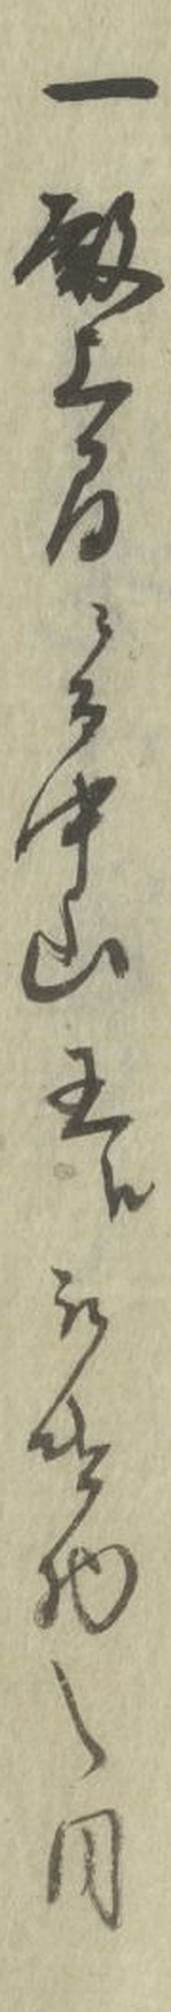一殿上間に而中山王え被遣物之目
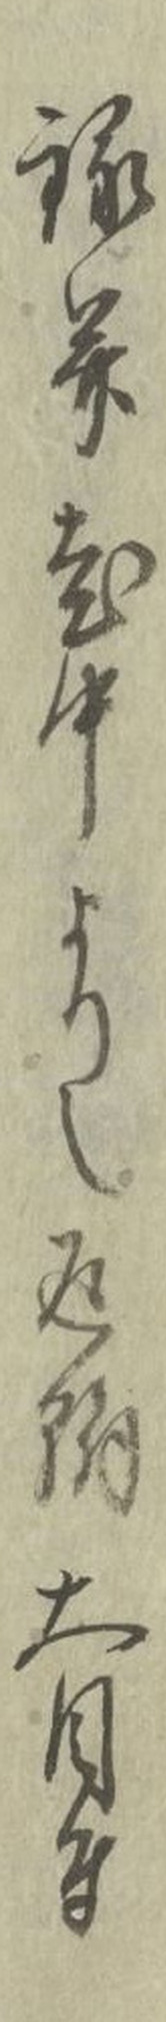録幷老中より之返翰大目付
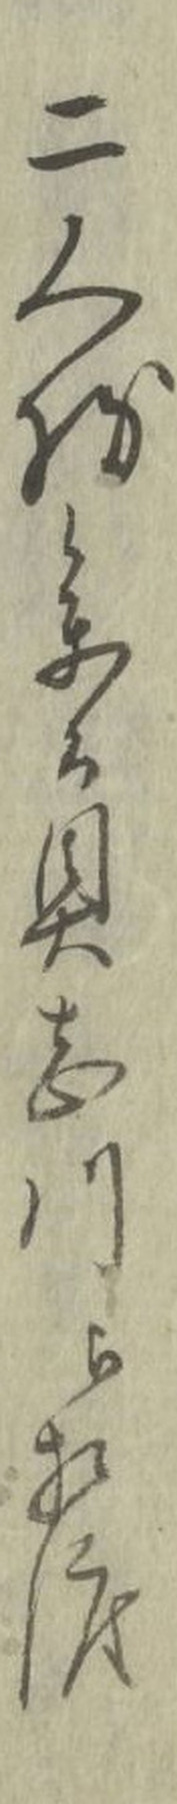二人持参而具志川え相渡

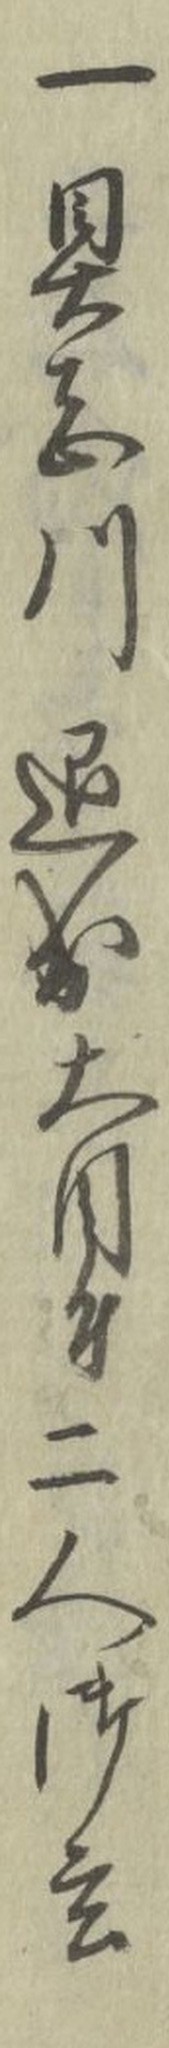一具志川退出大目付二人御玄
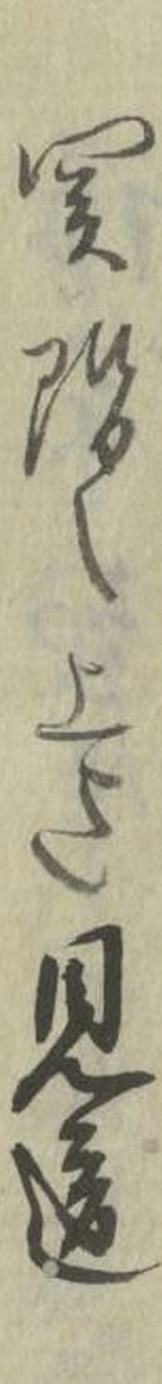関階之上迄見送
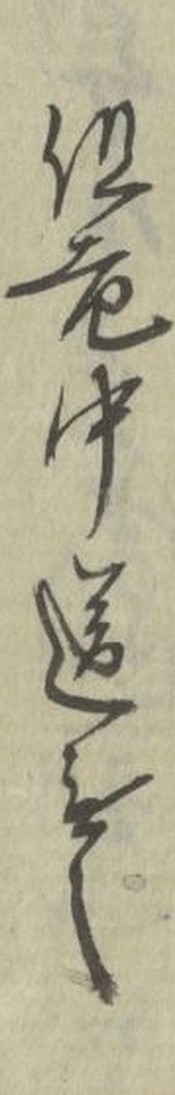但老中送無之
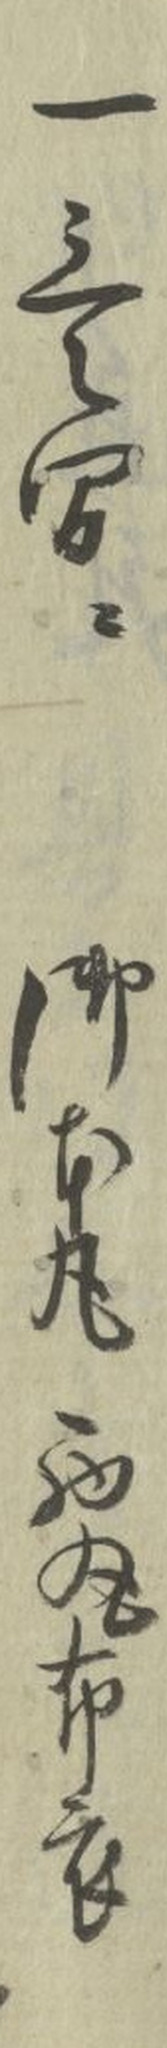一三之間に御本丸西丸布衣
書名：琉球来朝記 自八至十四終
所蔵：University of the Ryukyus Library
